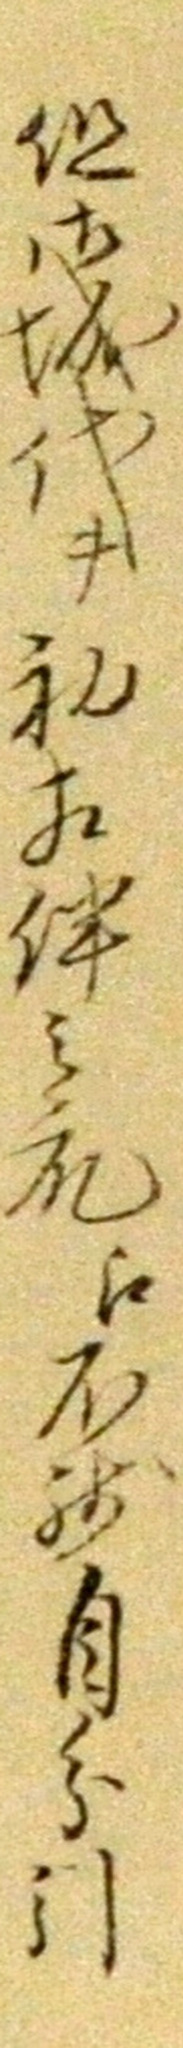但御城代ヲ初相伴之衆江不残自分引

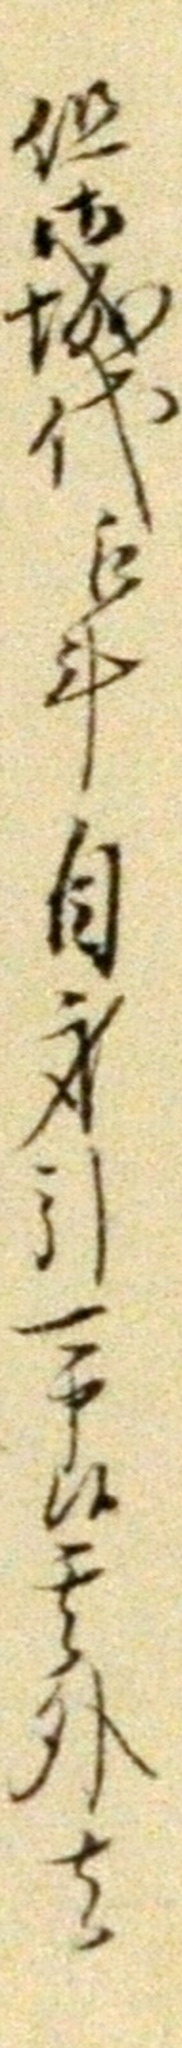但御城代江計自身引可申候其外者
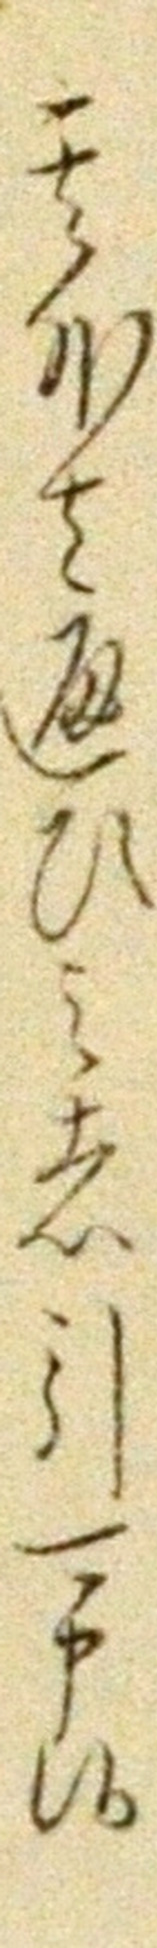其外者通ひ之者引可申候
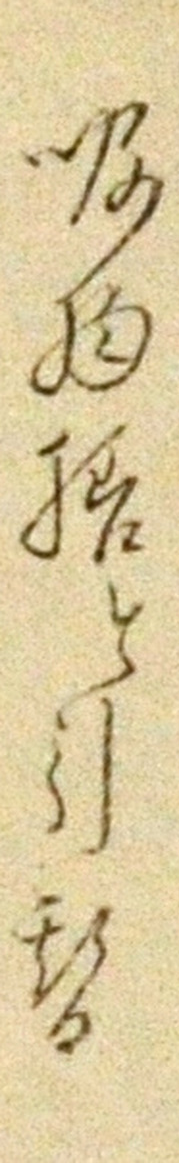吸物膳と引替
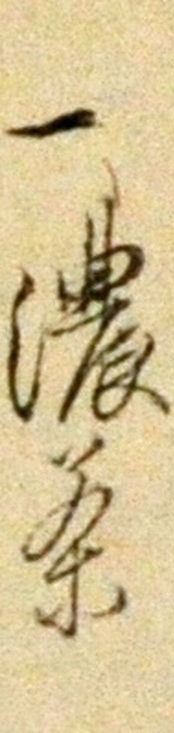一濃茶
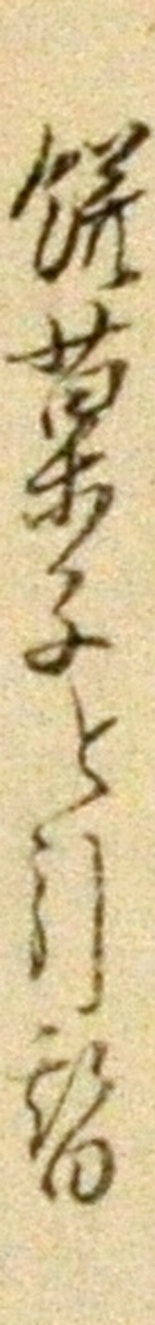餅菓子と引替
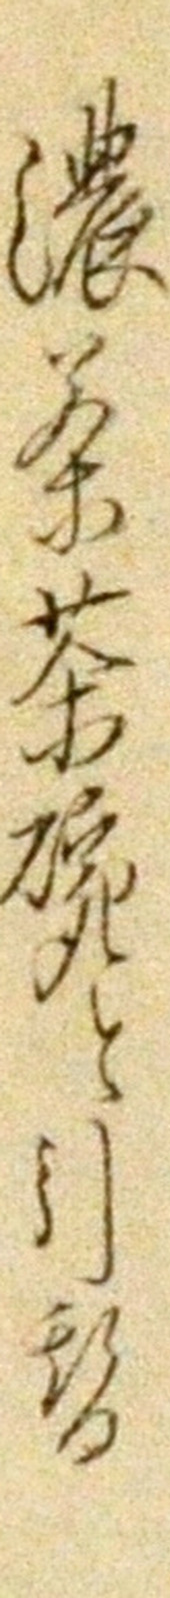濃茶茶碗と引替
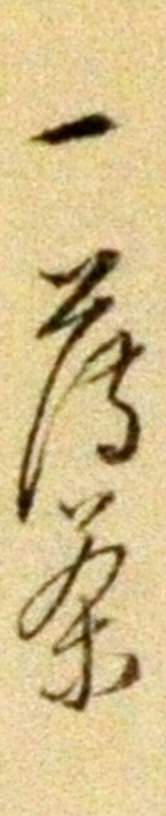一濃茶
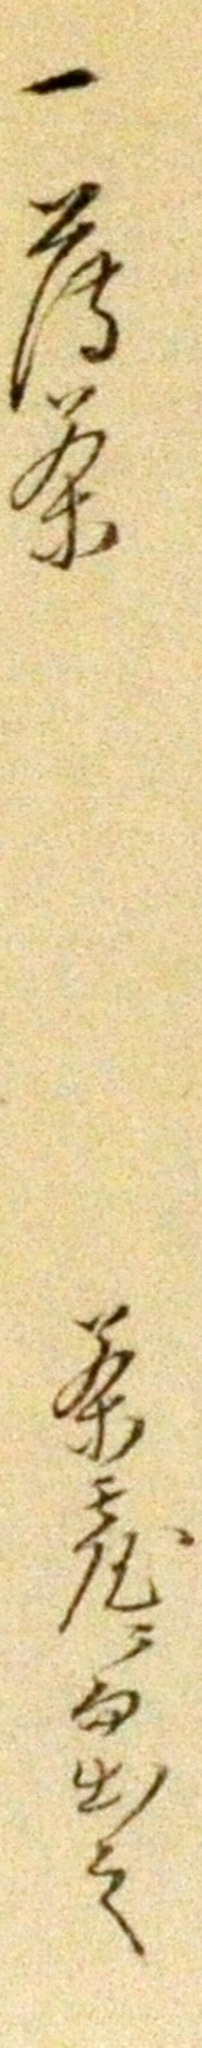一薄茶茶臺ニ而出之
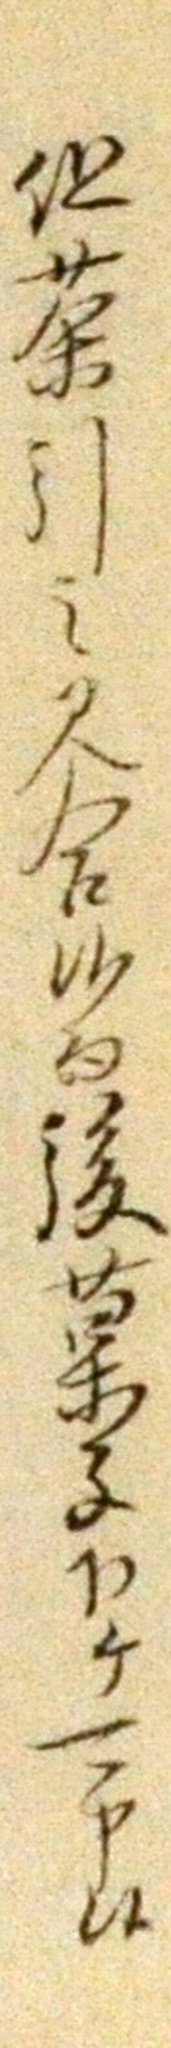但茶引之見合候而後菓子下ヶ可申候
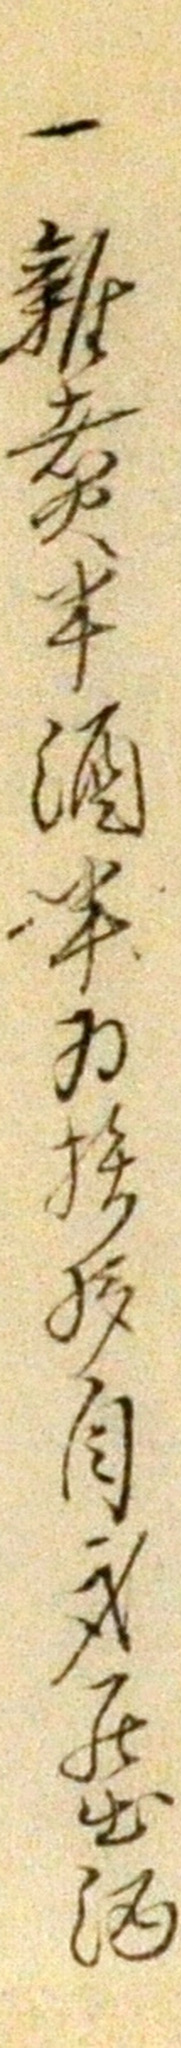一雑煮半酒半為挨拶自身罷出酒
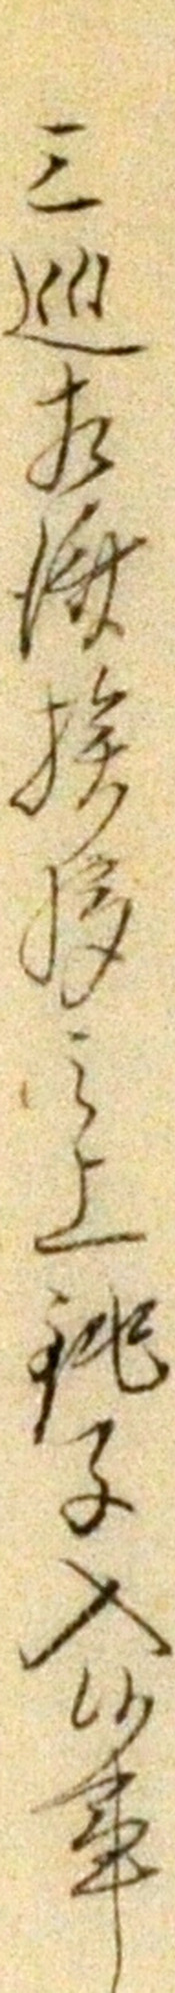三巡相済挨拶之上銚子入候事
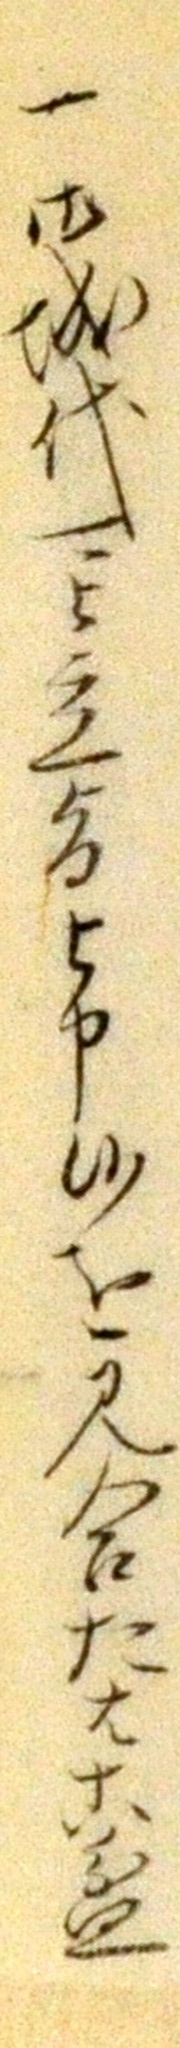一御城代可被立旨被申候を見合たはこ盆
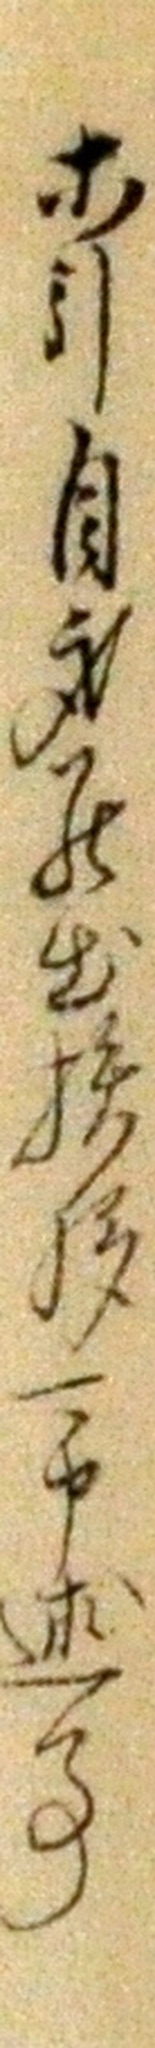等引自身罷出挨拶可申述事
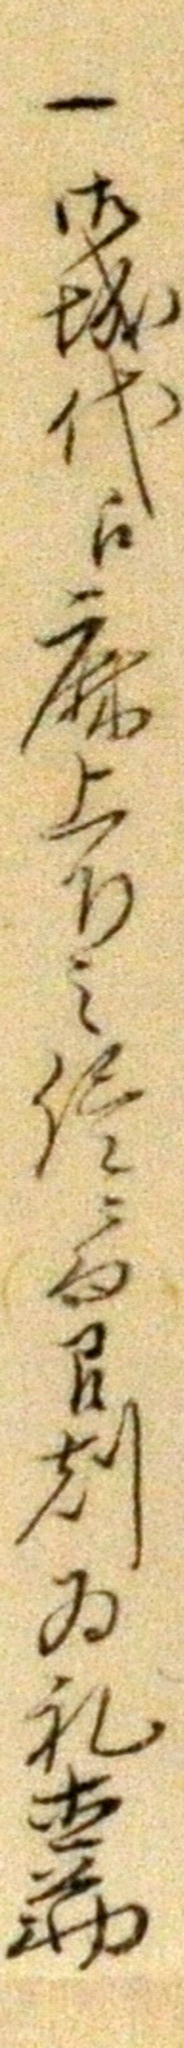一御城代江麻上下之儘ニ而即刻為礼直勤
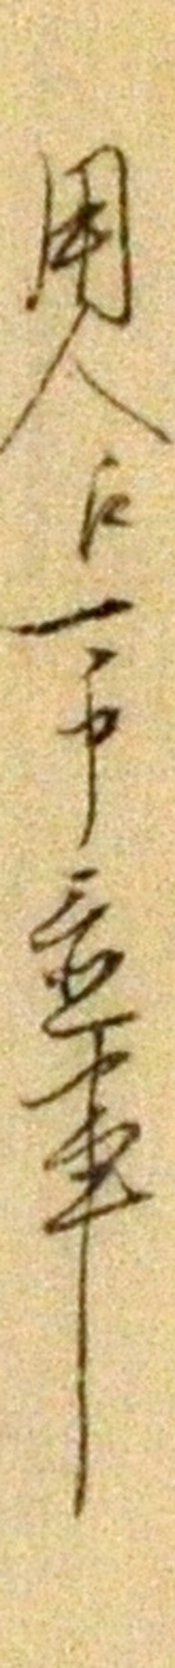用人江可申置事
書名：大阪加番関係諸書留〔一括〕
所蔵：伊那市立高遠町図書館・合同会社AMANE
